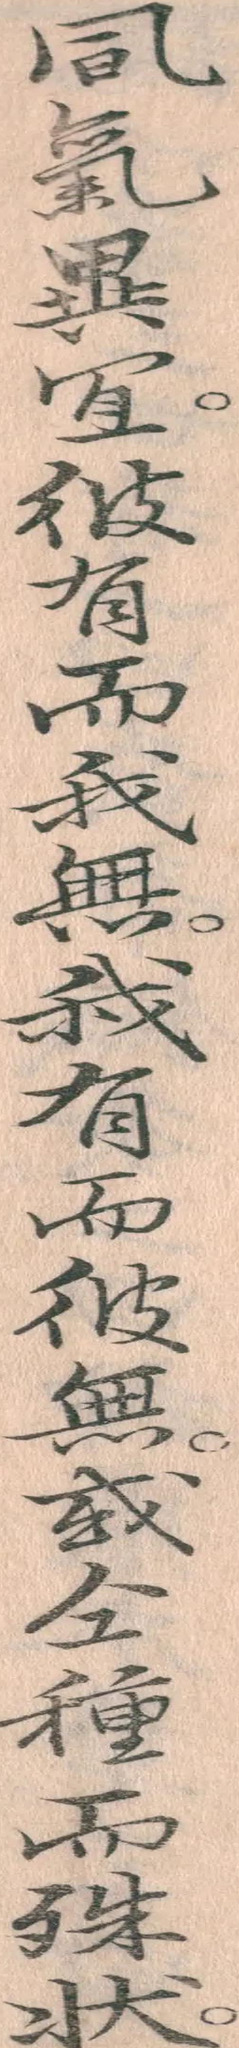風気異宜。彼有而我無。我有而彼無。或同種而殊状。
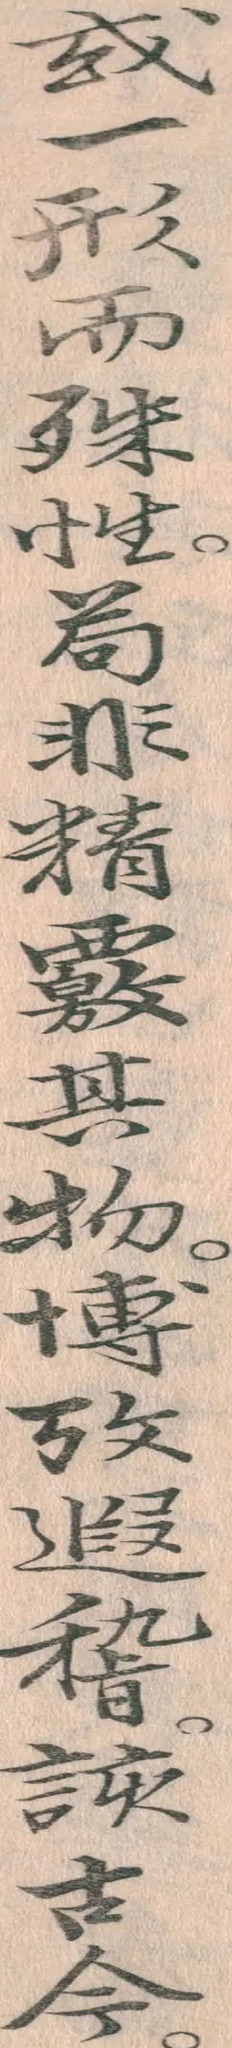或一形而殊性。苟非精覈其物。博攷遐稽。該古今。
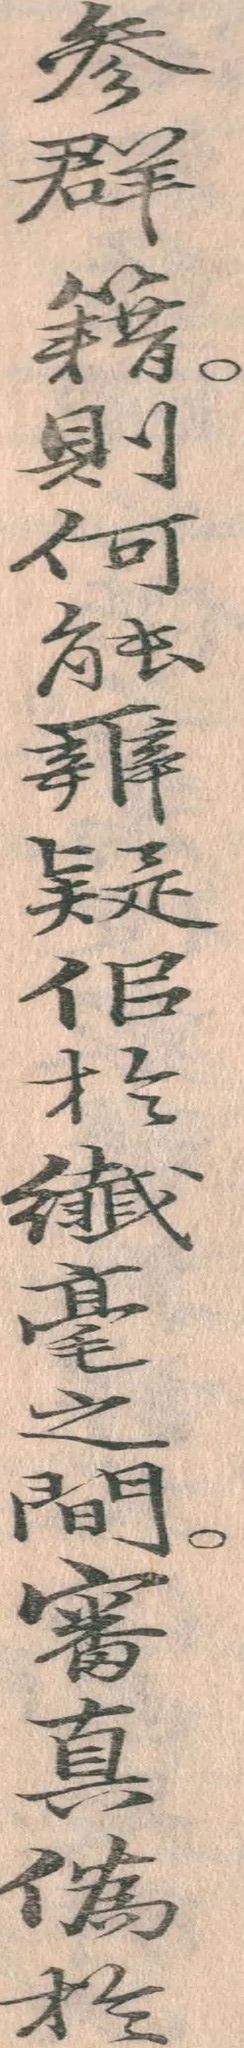参群籍。則何能弁疑似於繊毫之間。審真偽於
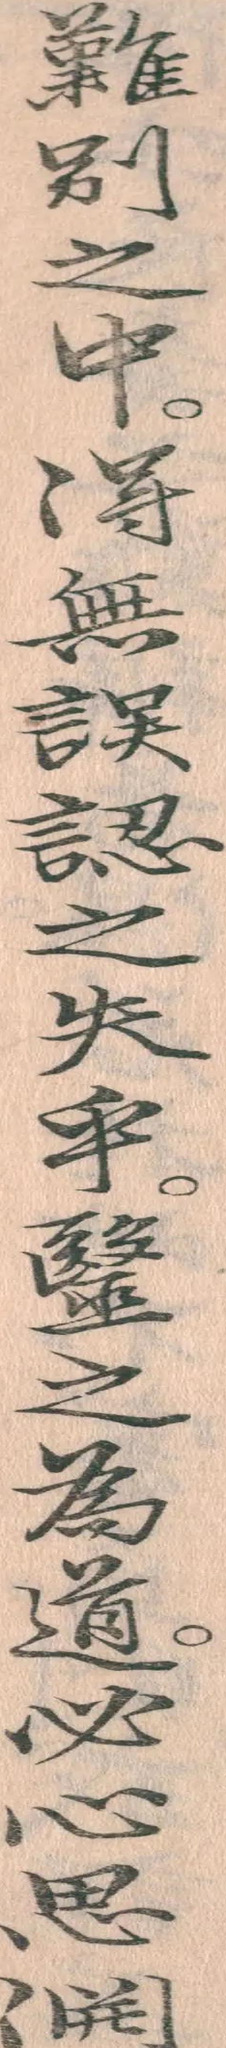難別之中。得無誤認之失乎。医之為道。必心思
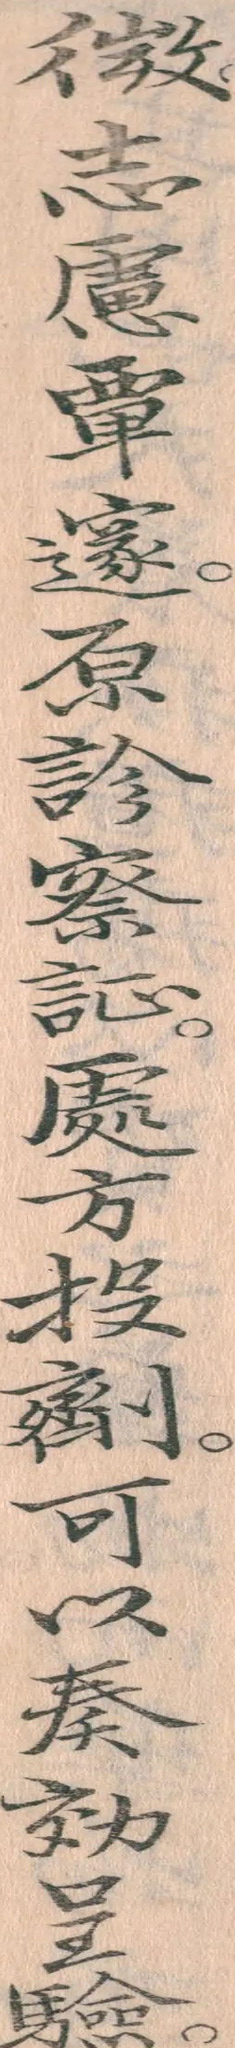微。志慮覃邃。原診察証。処方投剤。可以奏効呈験。
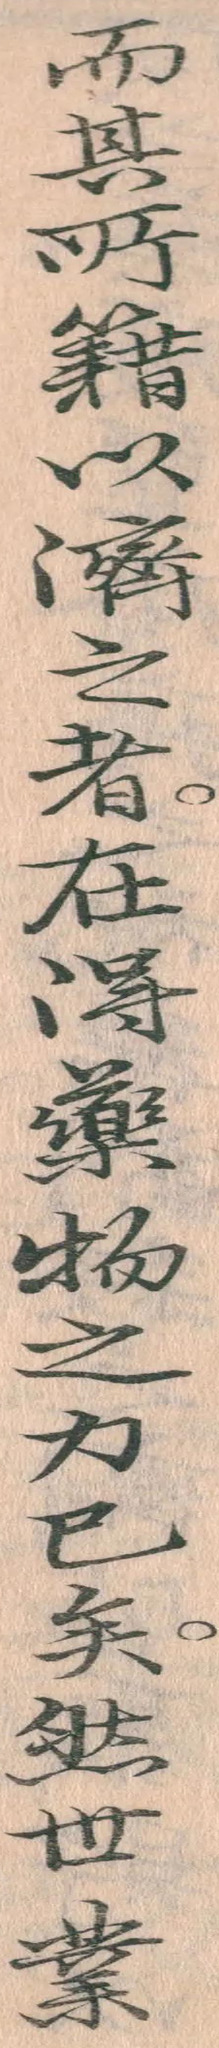而其所籍以済之者。在得薬物之力巳矣。然世業
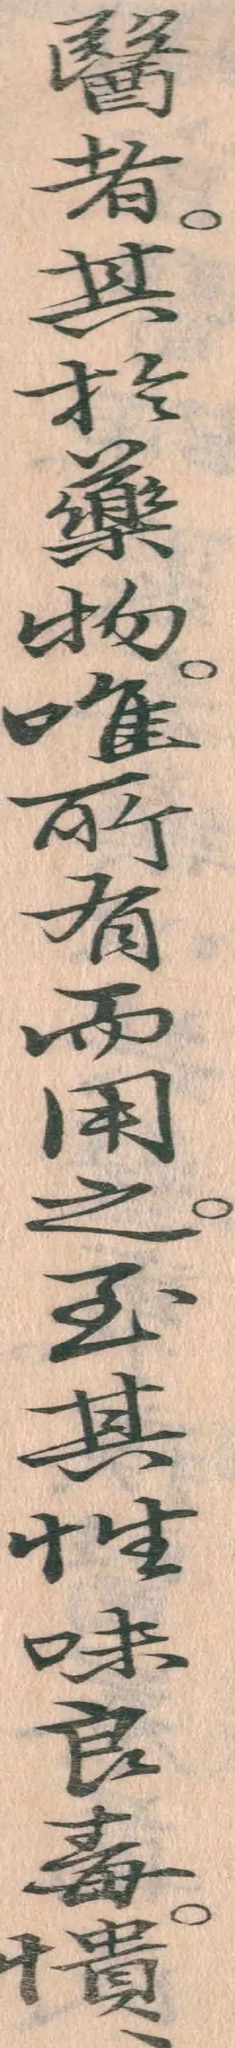医者。其於薬物。唯所有而用之。至其性味良毒。憒、
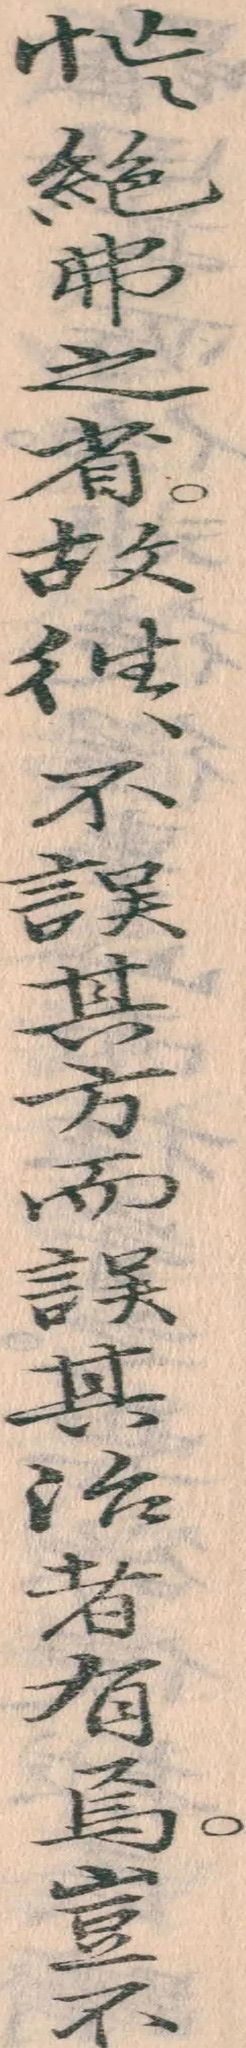㤺絶弗之省。故往、不誤其方而誤其治者有焉。豈不
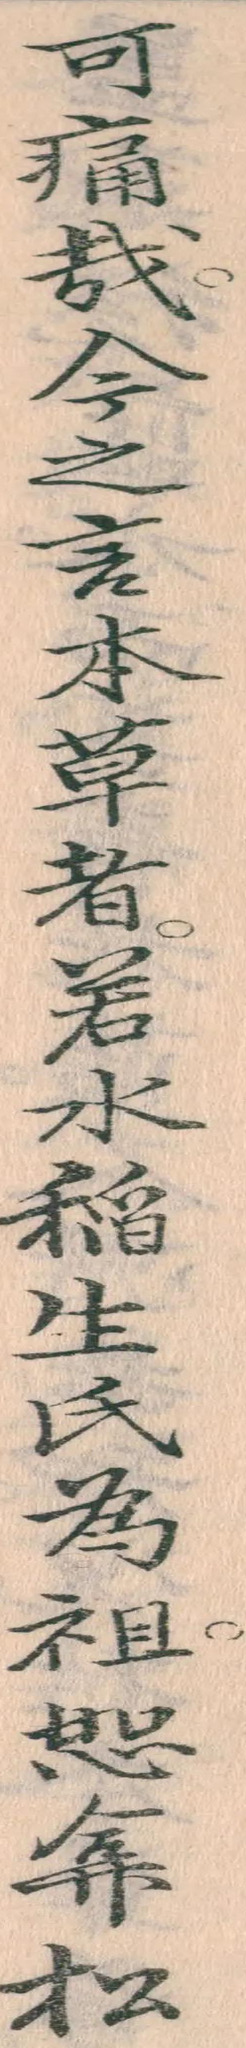可痛哉。今之言本草者。若水稲生氏為祖。恕弇松
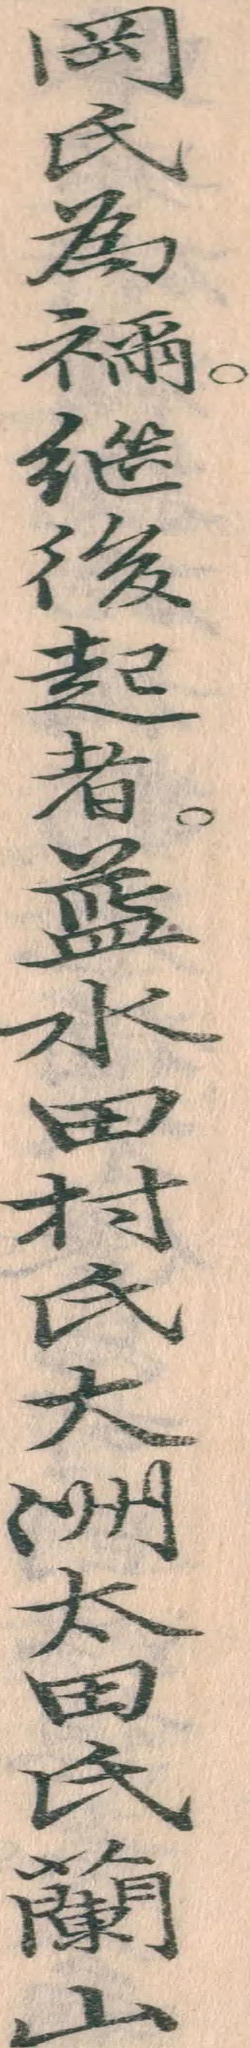岡氏為禰。継後起者。藍水田村氏大洲太田氏蘭山
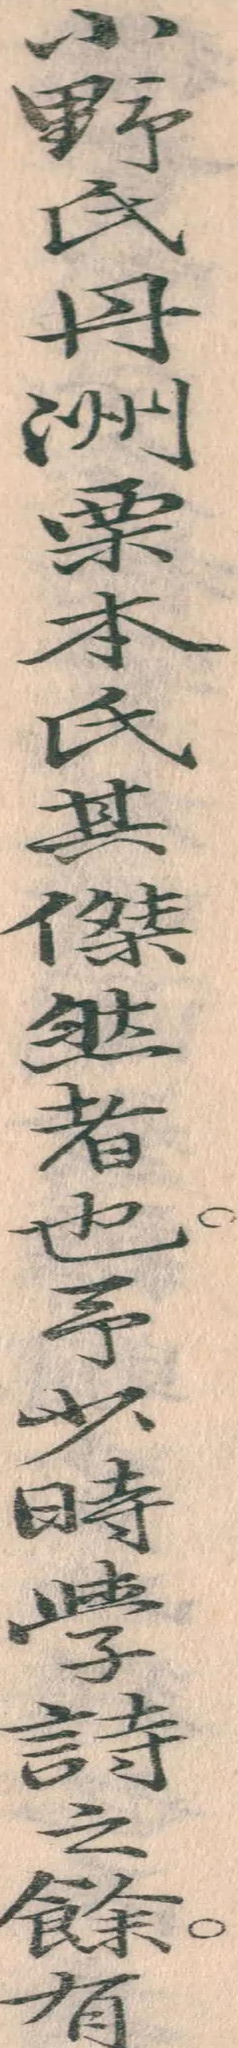小野氏丹洲栗本氏其傑然者也。予少時学詩之余。有
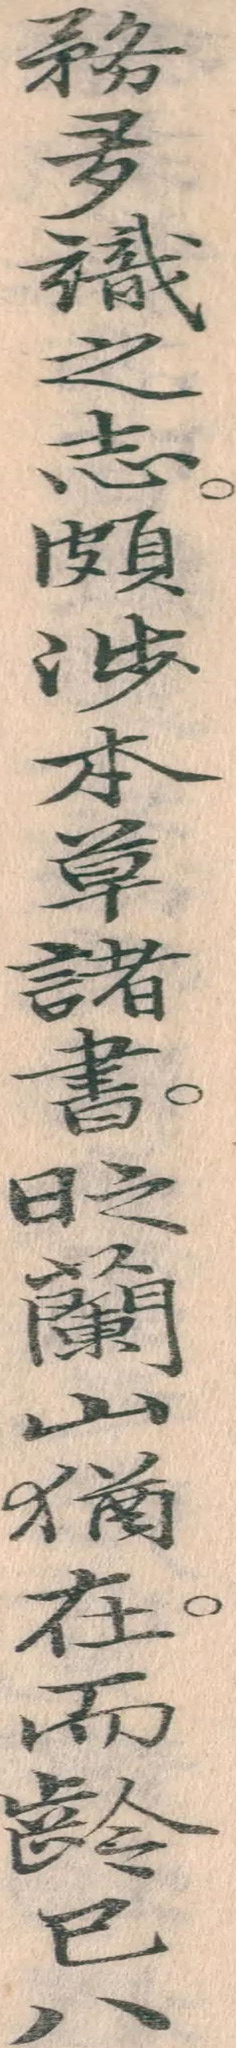務多識之志。頗渉本草諸書。時蘭山猶在。而齢巳八
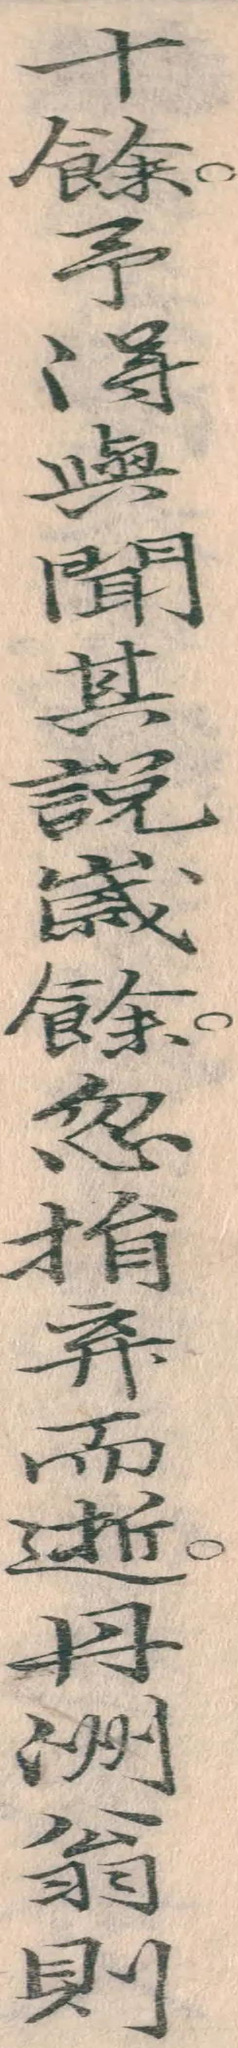十余。予得与聞其説歳余。忽捐棄而逝。丹洲翁則
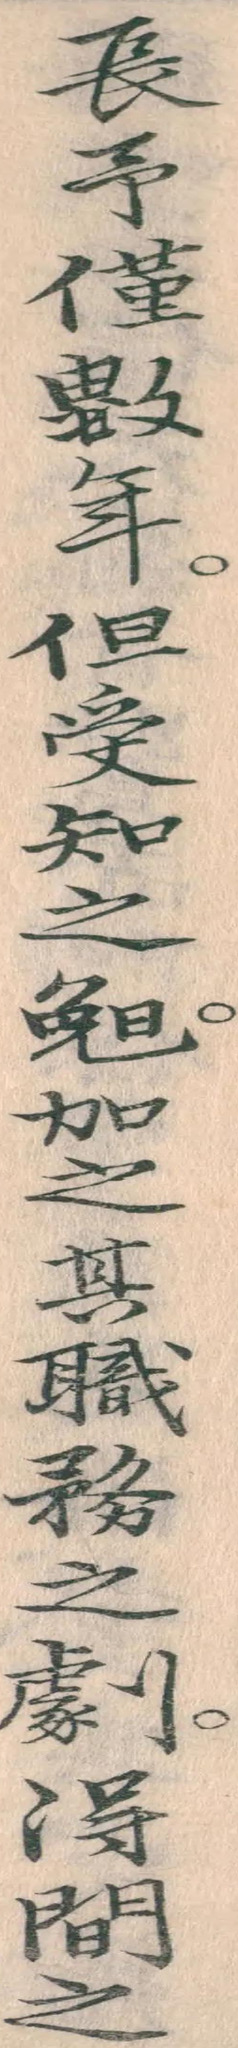長予僅数年。但受知之晩。加之其職務之劇。得得間之
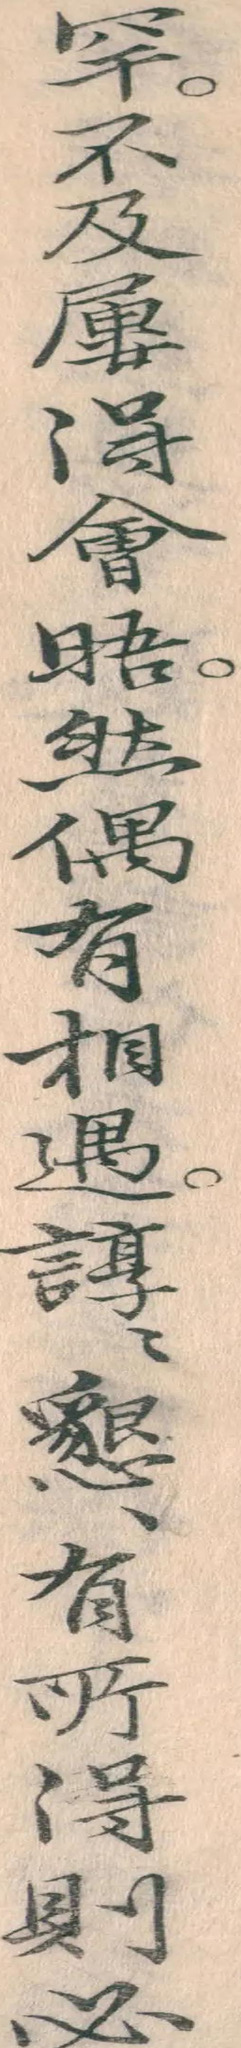罕。不及屢得会晤。然偶有相遇。諄ゝ懇、有所得則必
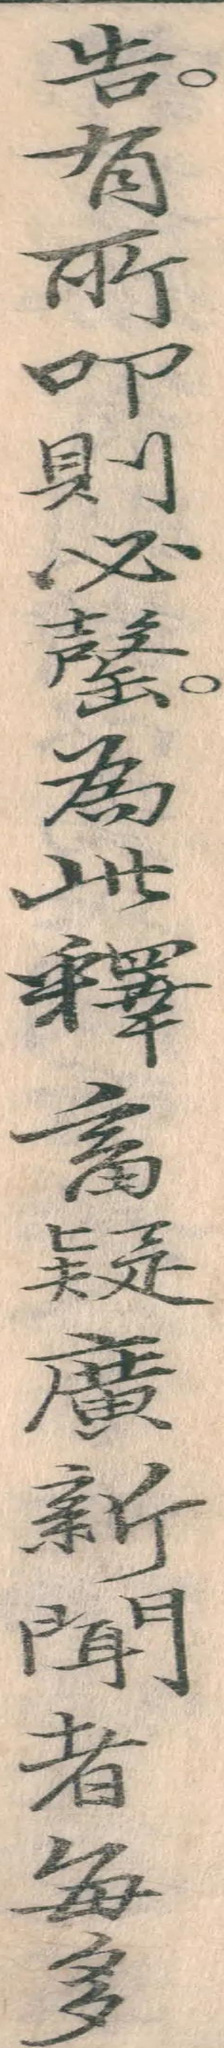告。有所叩則必罄。為此釈畜疑広新聞者毎多
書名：皇和魚譜 2巻
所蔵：国立国会図書館 National Diet Library, JAPAN
